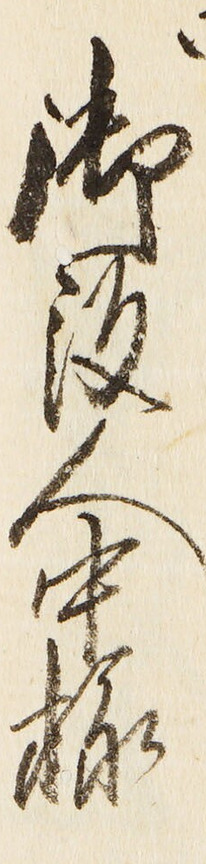御役人中様
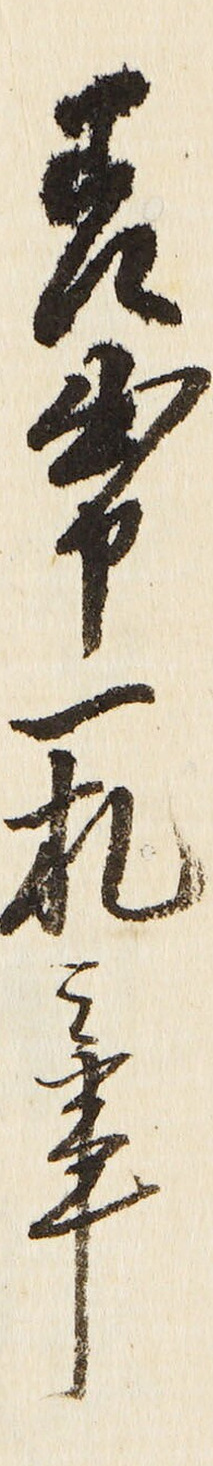差出申一札之事
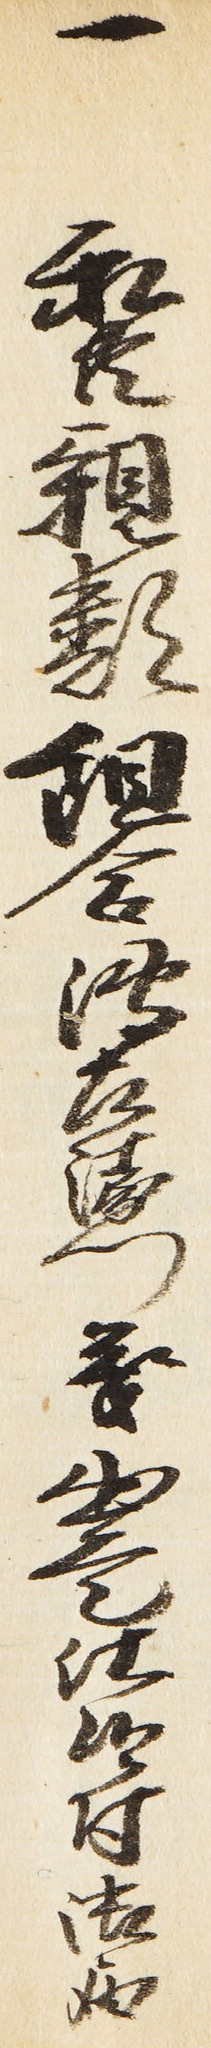一私共親類組合伝左衛門義出走仕候ニ付御届
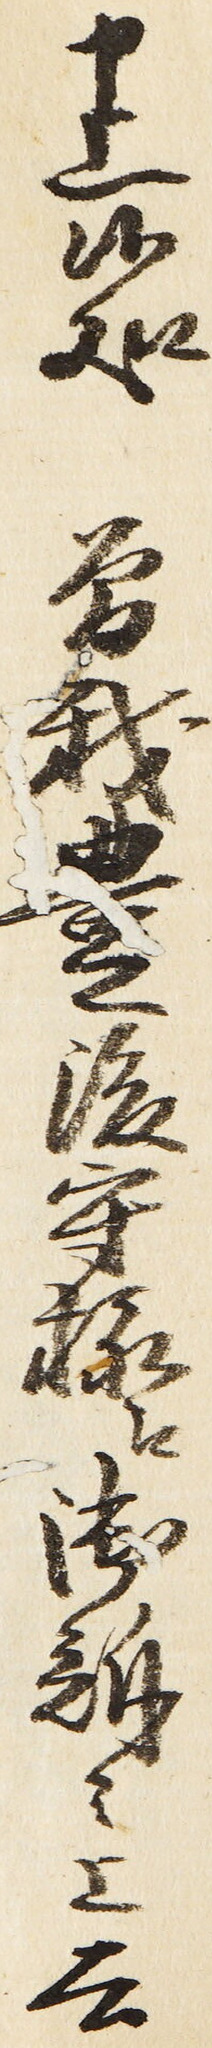申上候処曽我豊後守様江御訴之上去
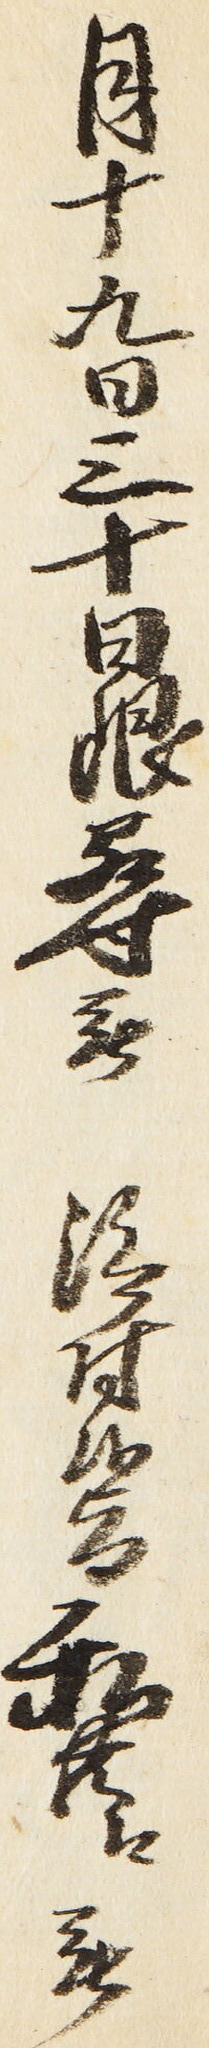月十九日三十日限尋被仰付候旨私共江被
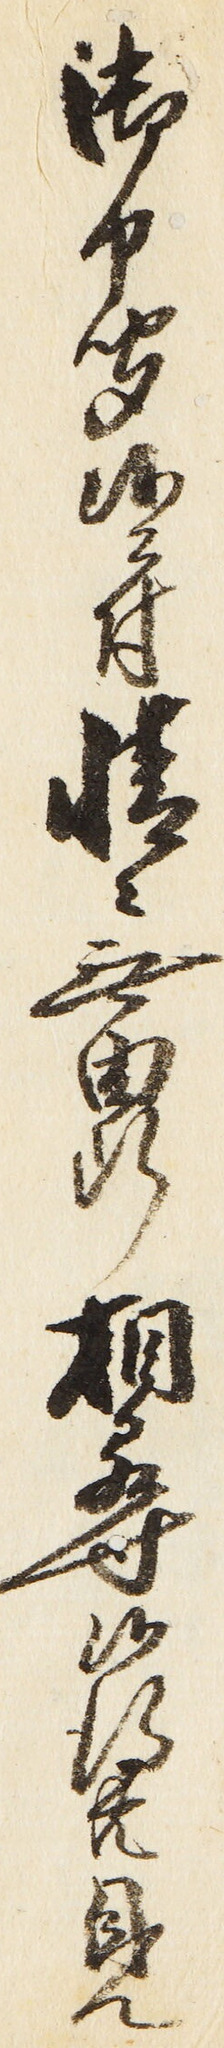御申聞候ニ付情々無油断相尋候得共見
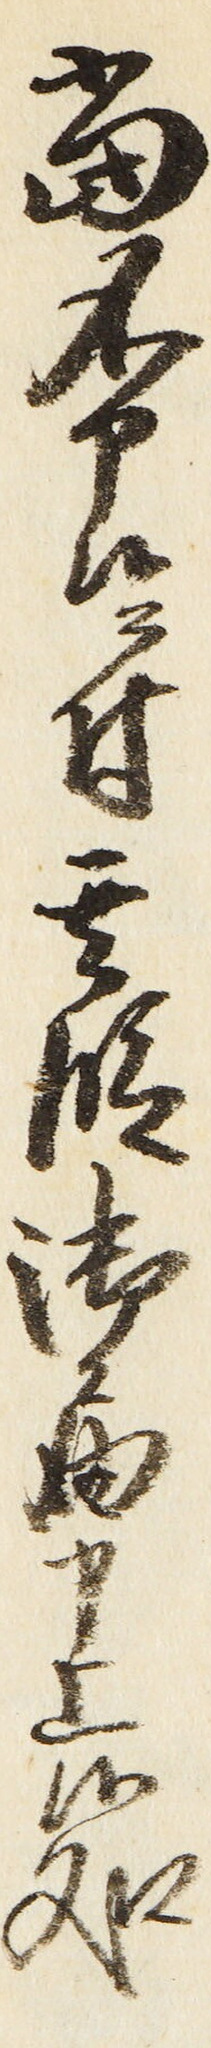当不申候ニ付其段御届申上候処
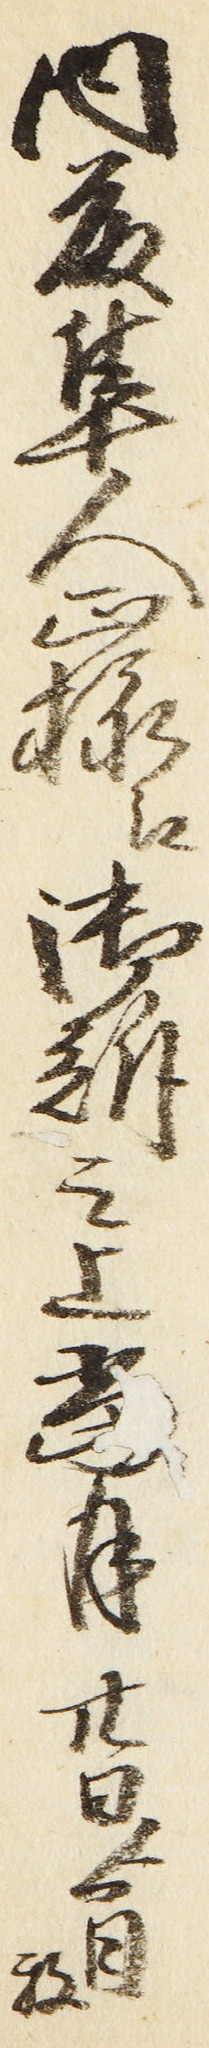内藤隼人正様江御訴之上当月廿日ゟ日数

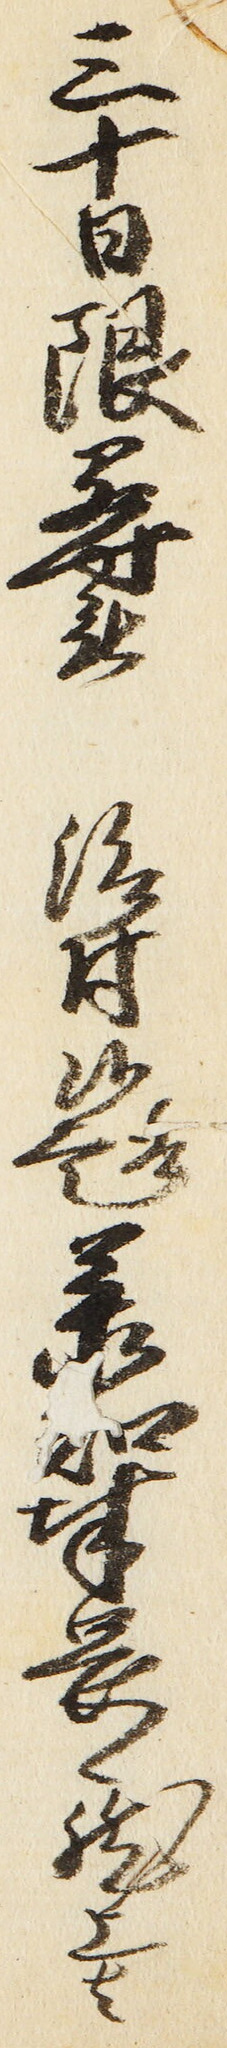三十日限尋被仰付候趣承知奉畏候然上者
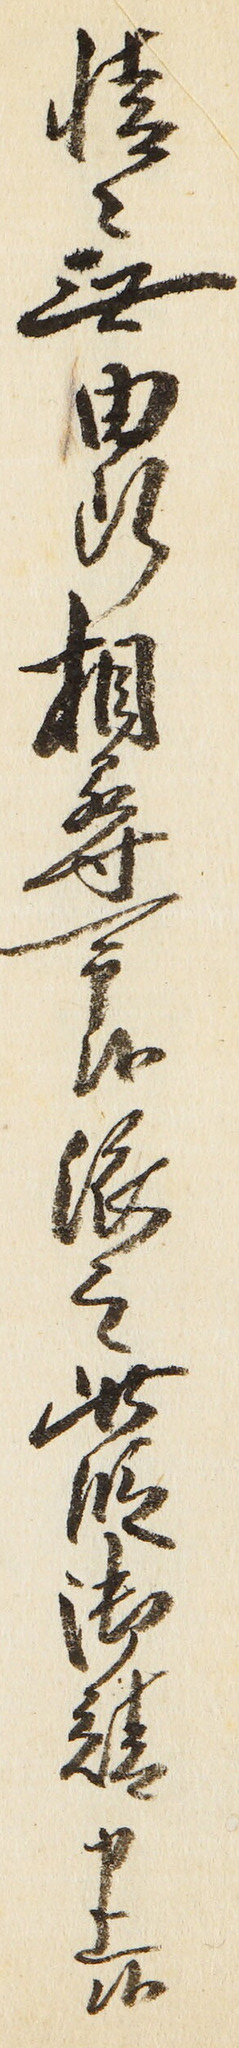情々無油断相尋可申候依之此段御請申上候
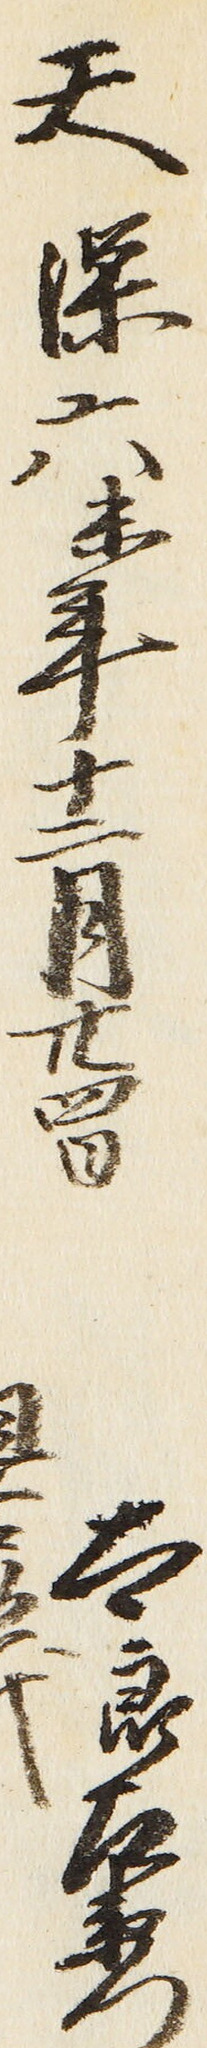天保六未年十二月廿四日親類惣代
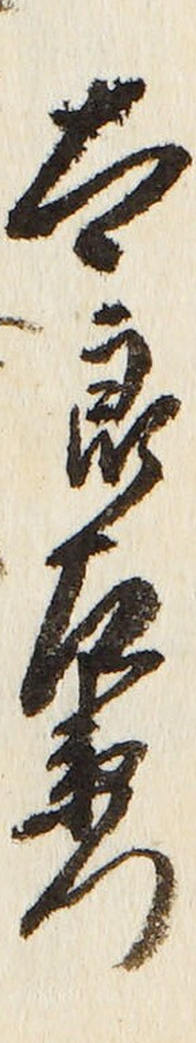太郎左衛門
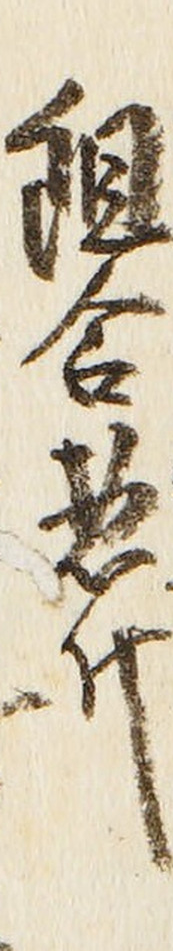組合惣代
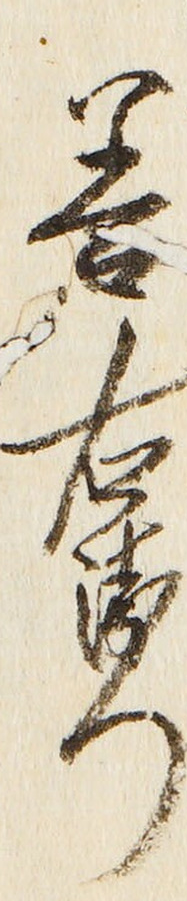善右衛門
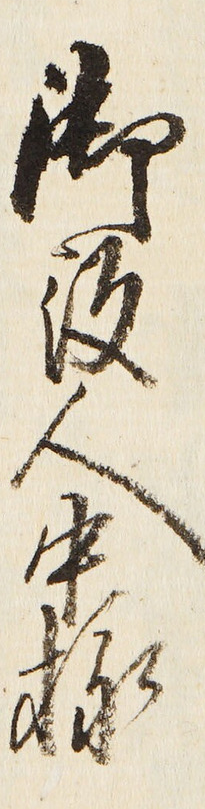御役人中様
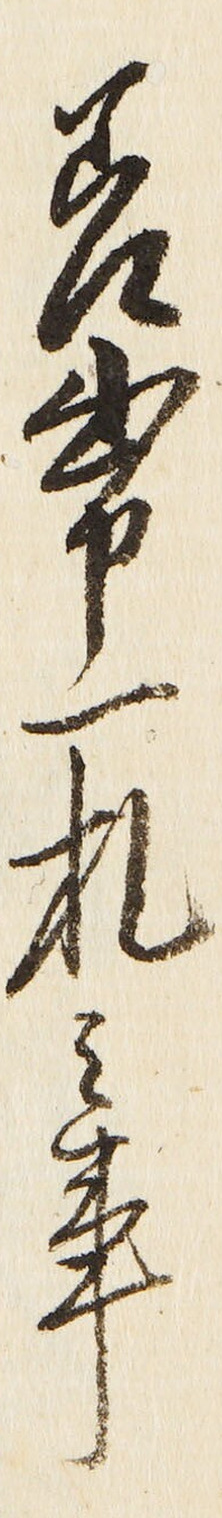差出申一札之事
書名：難船一件記録
